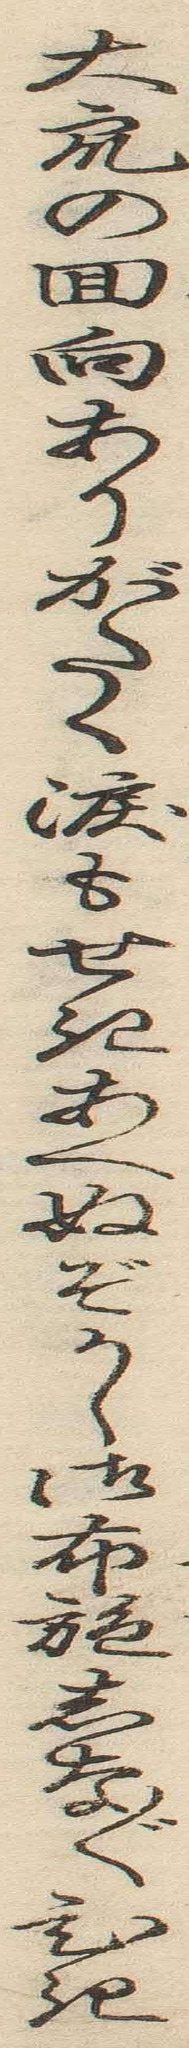大衆の囬向ありがたく涙もせきあへぬぞかし御布施しな〴〵ひき

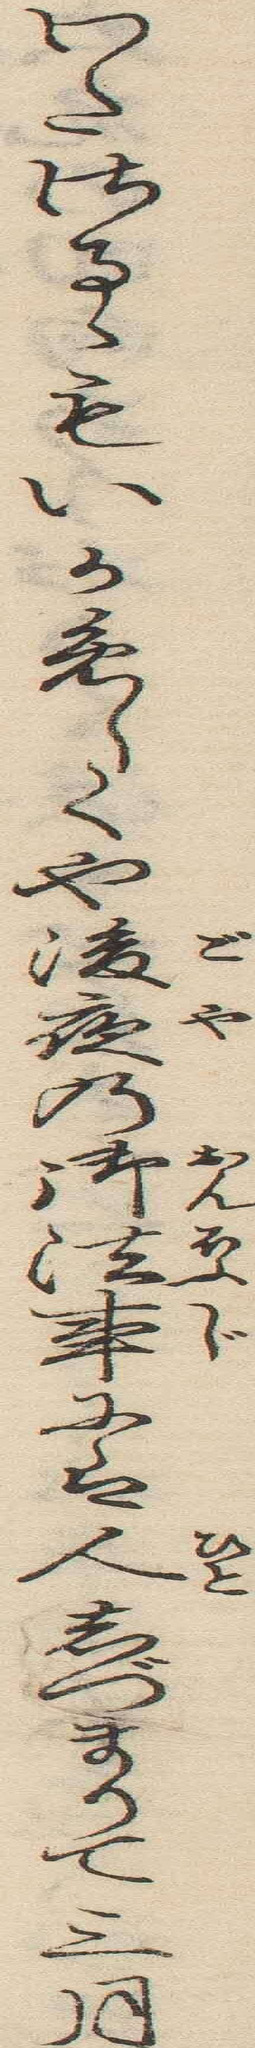わたさるゝもいかめしくや後夜の御法事には人しづまりて三月
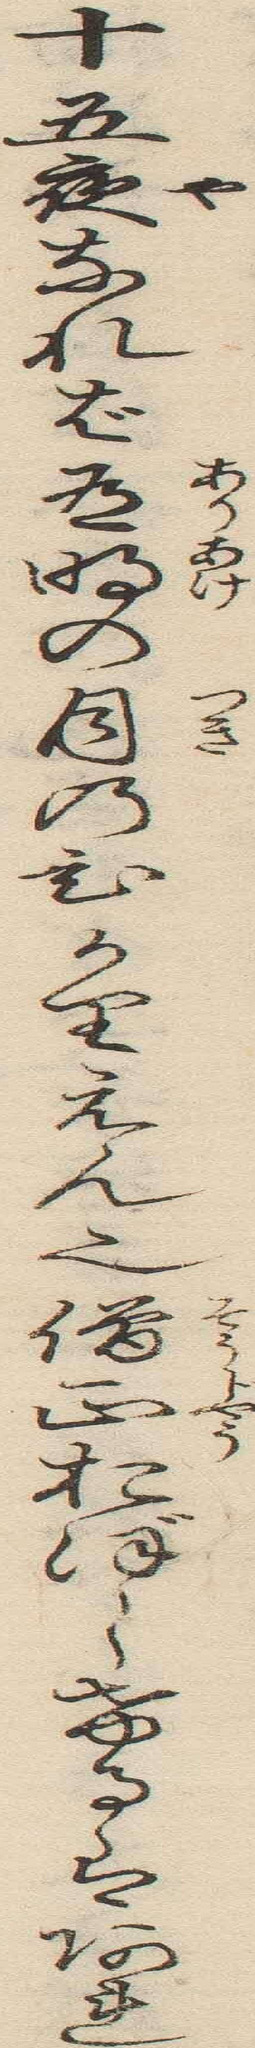十五夜なれば有明の月のひかりえん也僧正おぼしけるはあれ
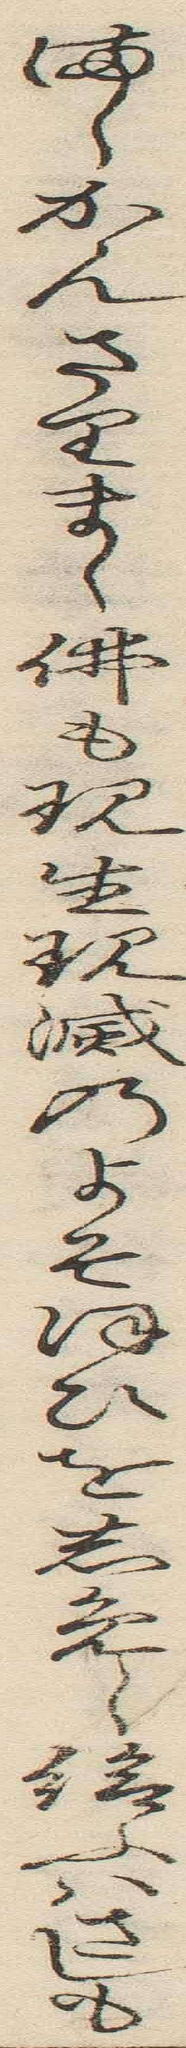ましかんさりまし佛も現生現滅のよそほひをしめし給ふはさしも
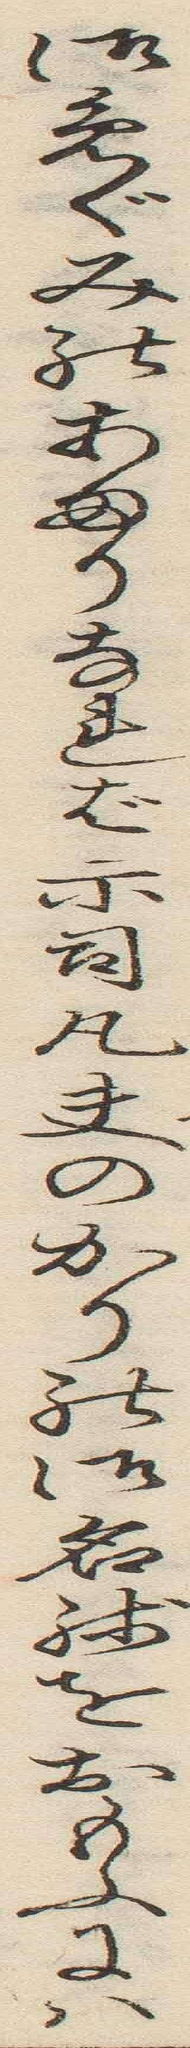御めぐみのあまりなれば示司凡夫のかりの御名残をおもふには
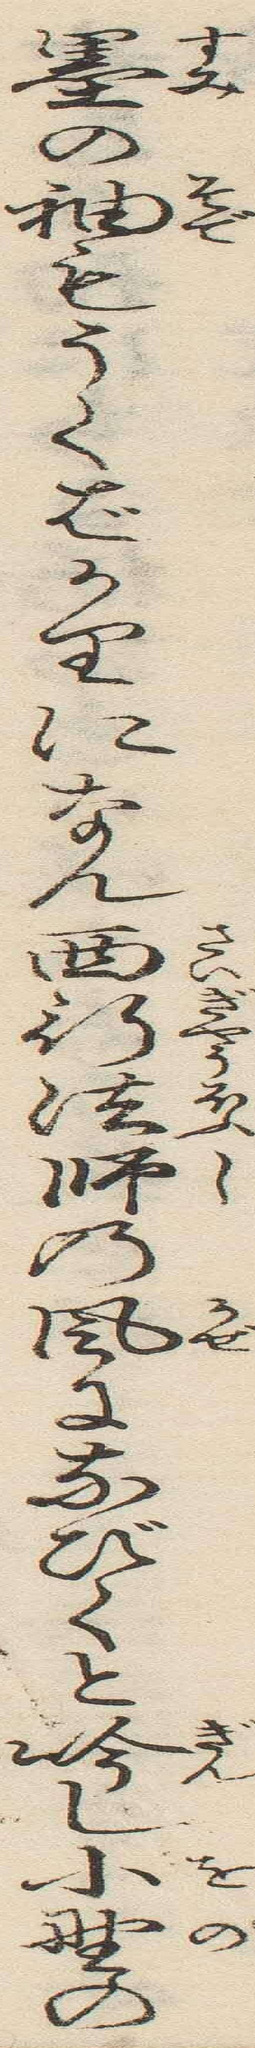墨の袖もかくばかりになん西行法師の風になびくと吟し小㙒の
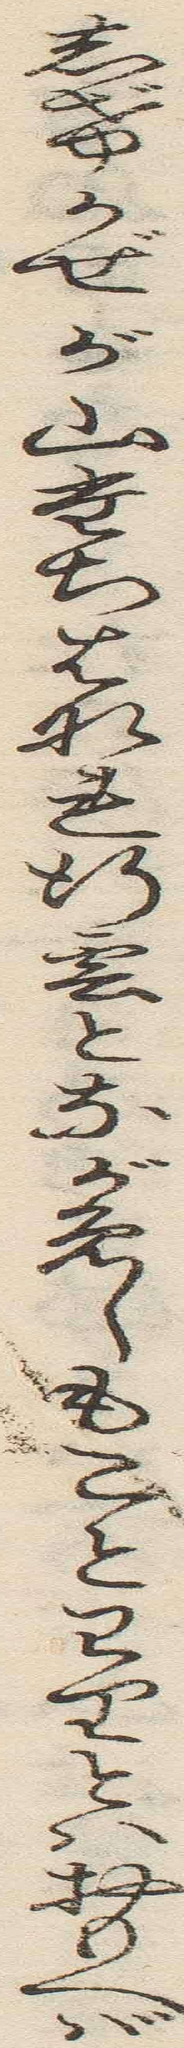しげかぜが山たちはなれ行雲とながめしもことわりとはおもへば
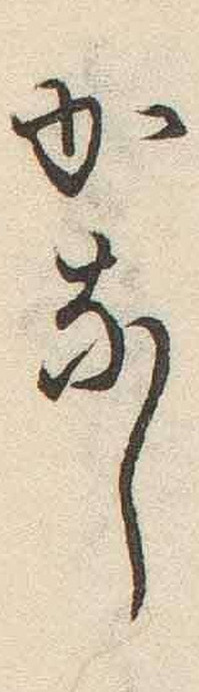かなし
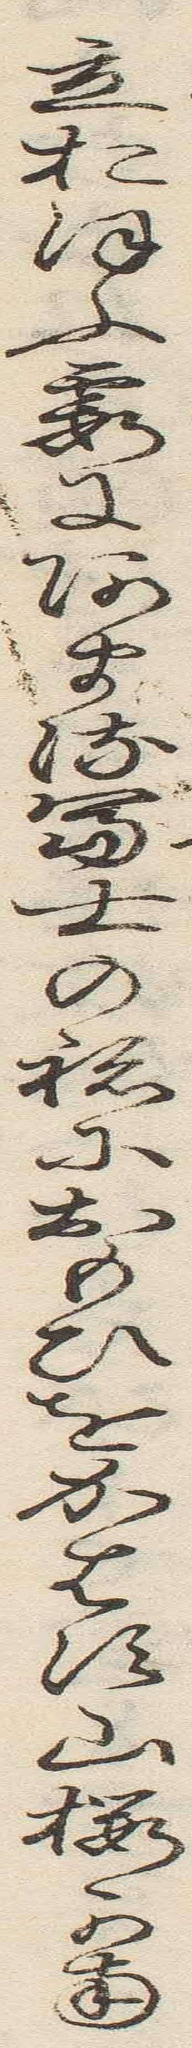立おもふ霞にあまる冨士のねにおもひをかはす山桜かな
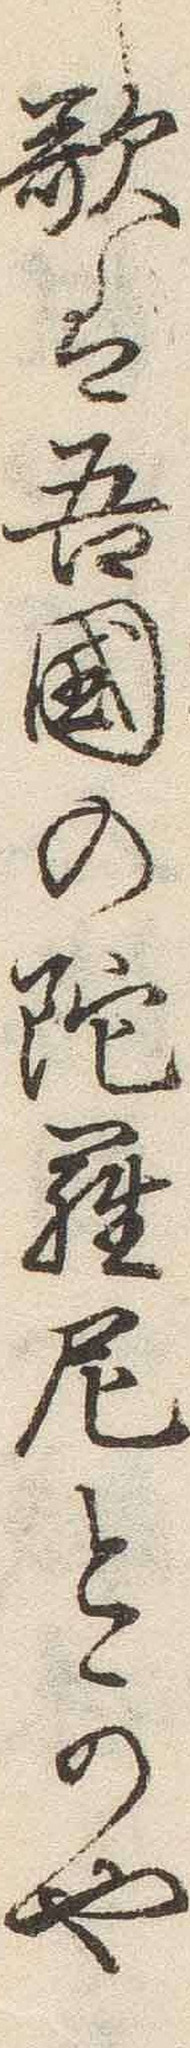歌は吾國の陀羅尼とかや
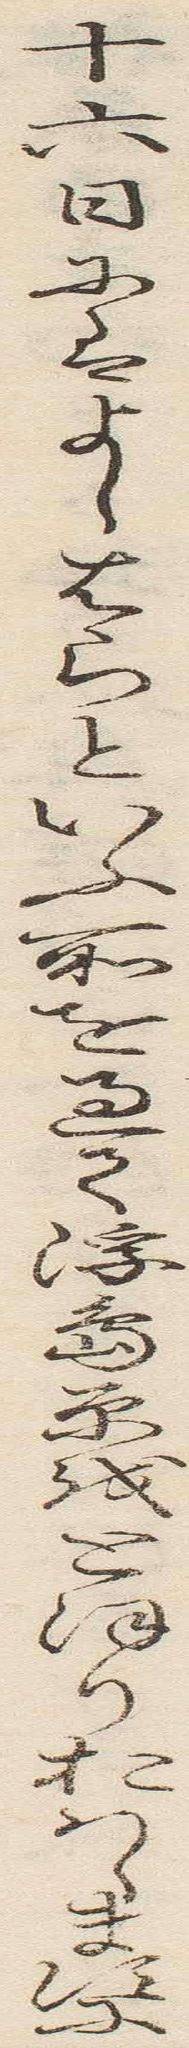十六日にはよしはらといふ所を過て浮島原をとほりおはしますに
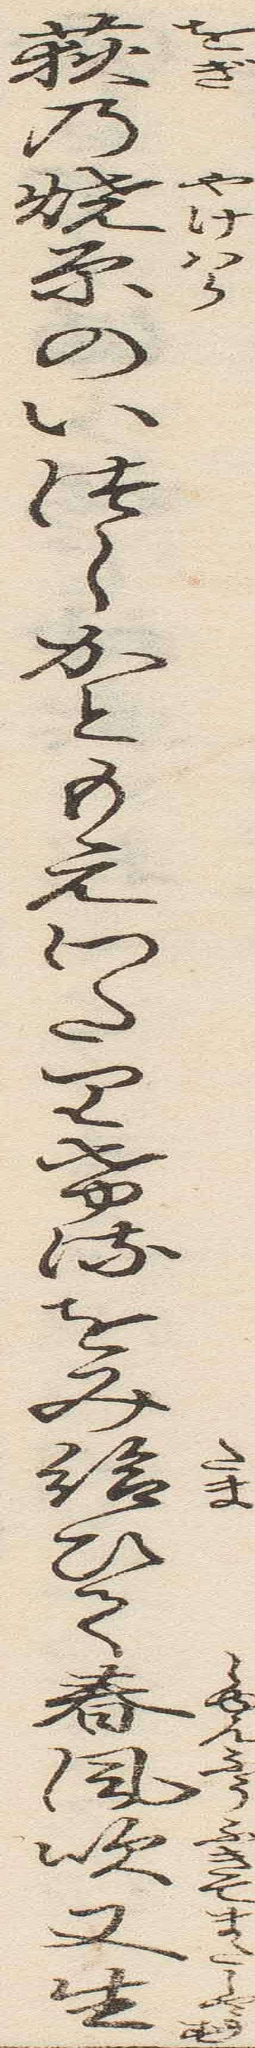荻の焼原のいつしかともえわたりけるをみ給ひて春風吹又生
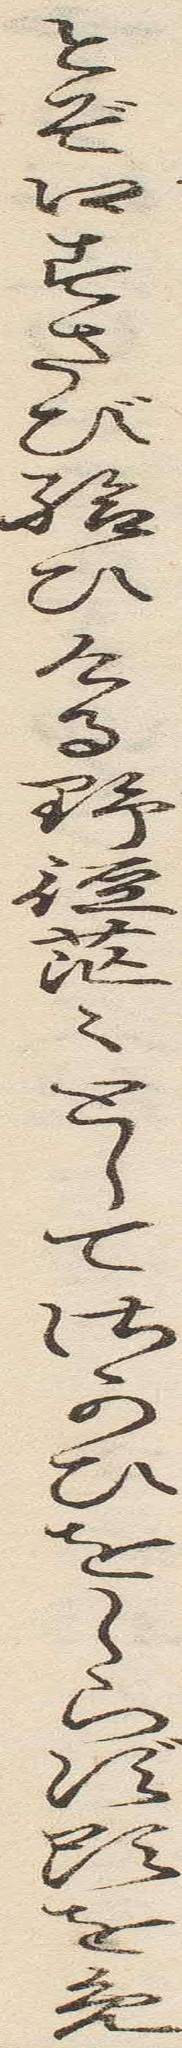とぞ口すさび給ひける野徑茫〻としてさかひをしらず頭をめ
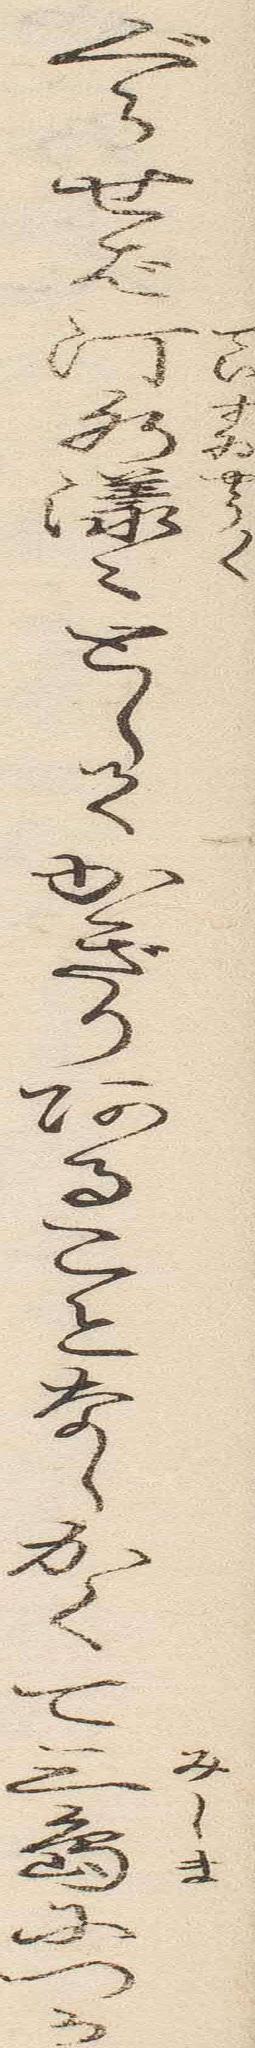ぐらせば汀水漾〻としてかぎりあることなしかくて三島につか
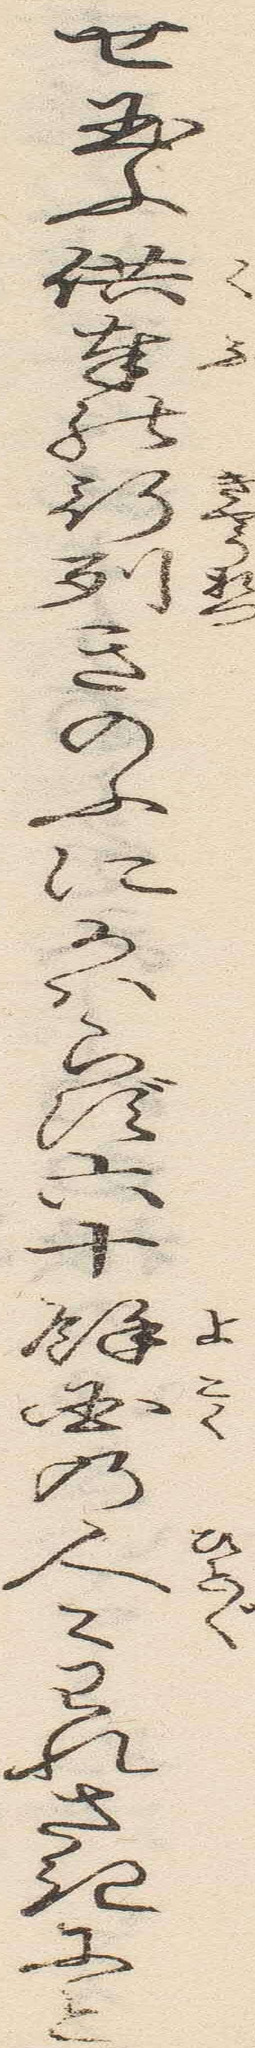せ玉ふ供奉の行列きのふにかはらず六十餘国の人〻われさきにと
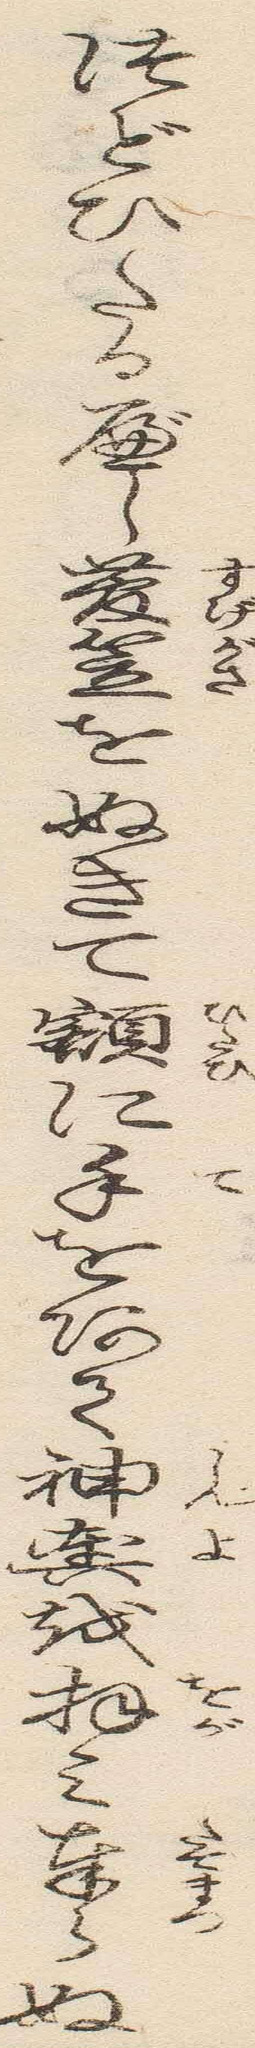つどひたるべし菅笠をぬきて額に手をあて神輿を拝み奉らぬ
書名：日光山志
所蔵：東京学芸大学附属図書館 国文学研究資料館
